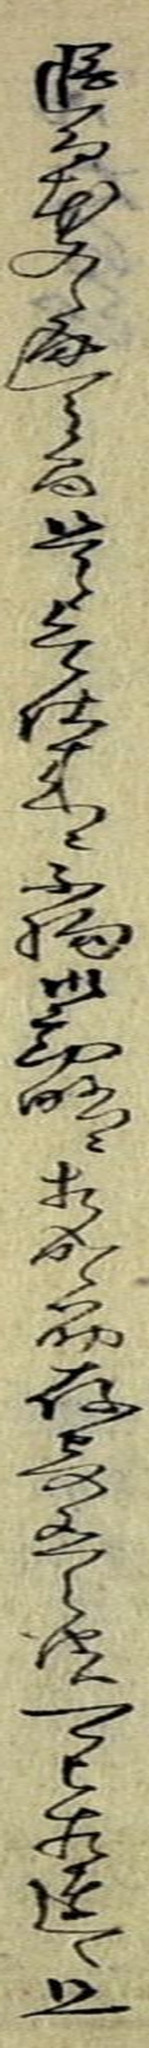追而本文之通に候間是迄仕来に不拘御勘略に相成候筋存寄有之儀は可被相達候且
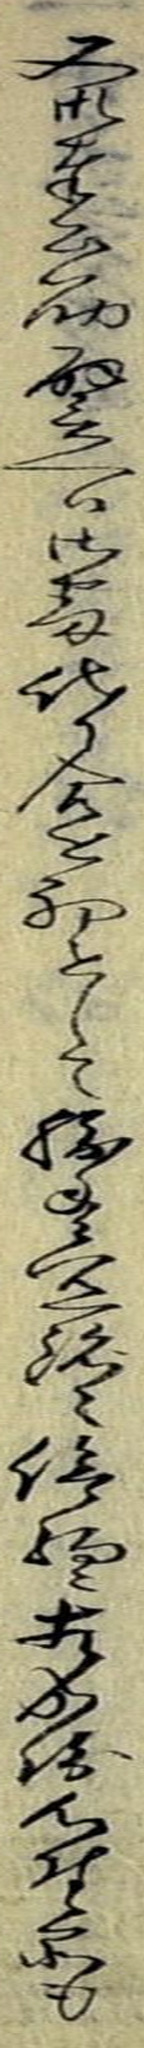又御奉公筋譬へは御番代り合を初として勝手宜銘々倹約に相成儀心付候品も
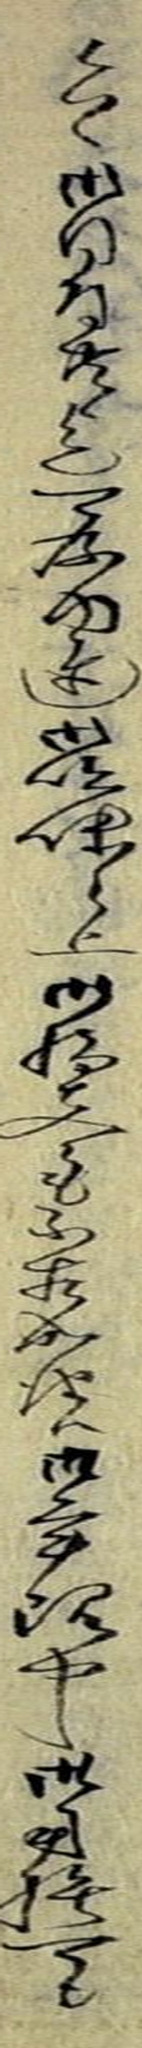候ハゝ御目付共迄可及内達御吟味之上御指支にも不相成儀は御年限中御用捨可被
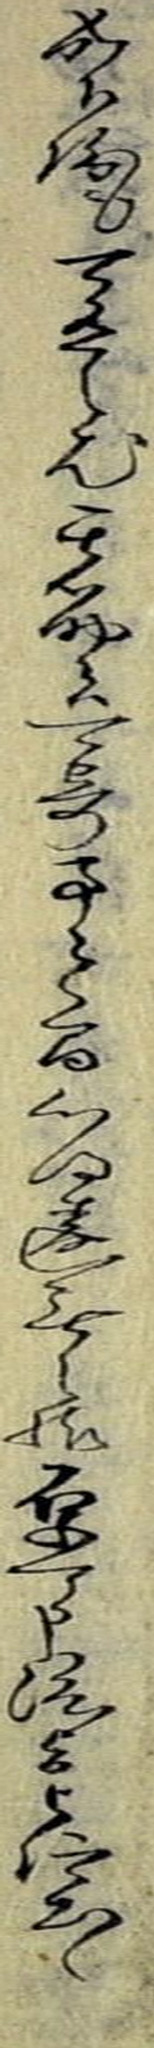成下儀も可有之尤其筋には可寄事に候間心得違無之様厚可申渡旨被仰出候
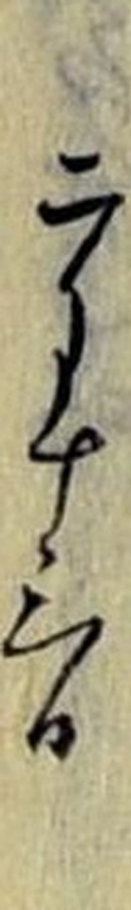二月十三日
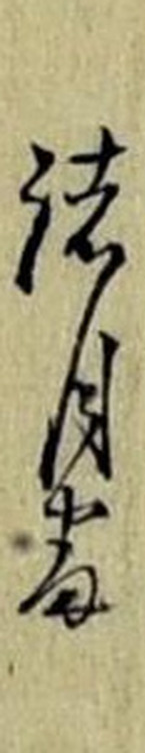諸月番
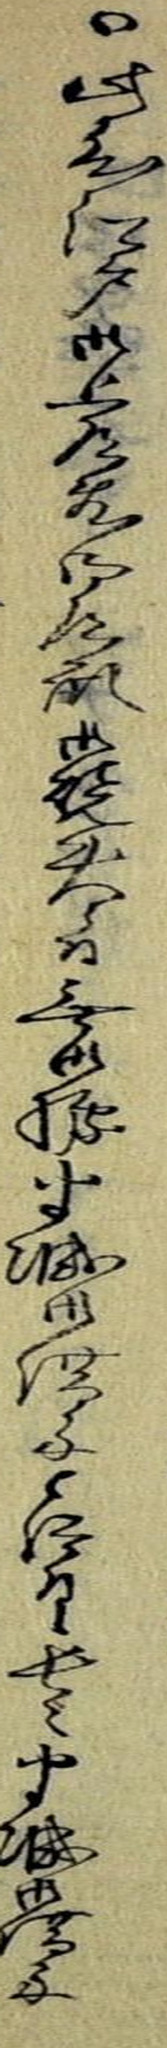○此度江戸御上屋敷御屋形御焼失に付無御拠半減御借米被仰付候長々半減御借米
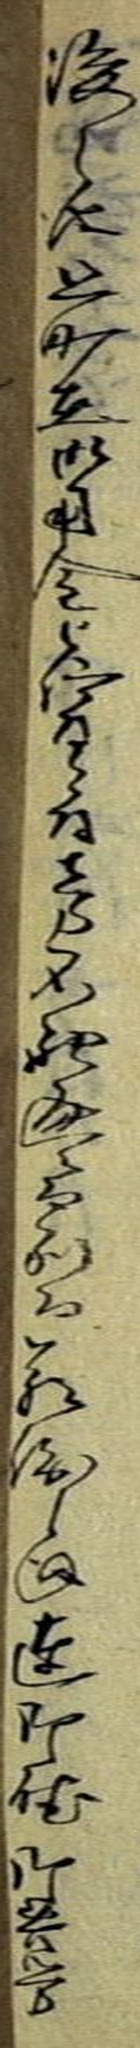後之儀且町在御用金被仰付候に付旁不融通に而別而難儀之趣達御聴御苦労
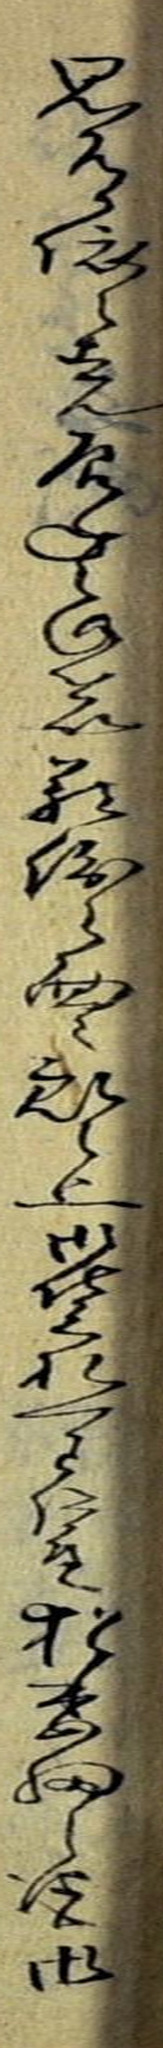思召候依之去ル辰年之趣を以難儀之面々願之上御貸札可被仰付候猶委細之儀は御
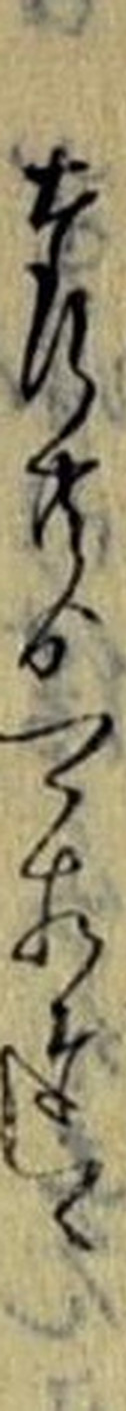奉行共ゟ可相達候
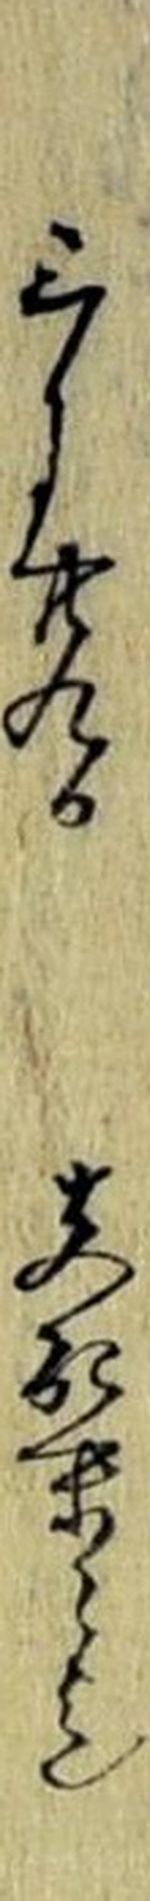三月廿九日支配末々迄
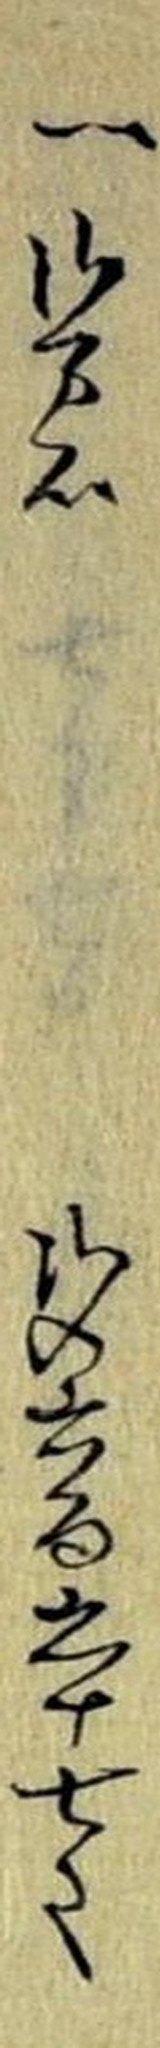一弐万石弐〆六百六十七匁
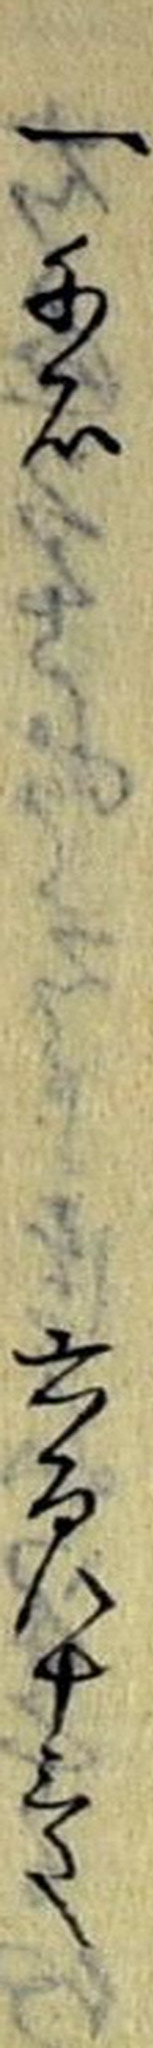一千石六百八十匁
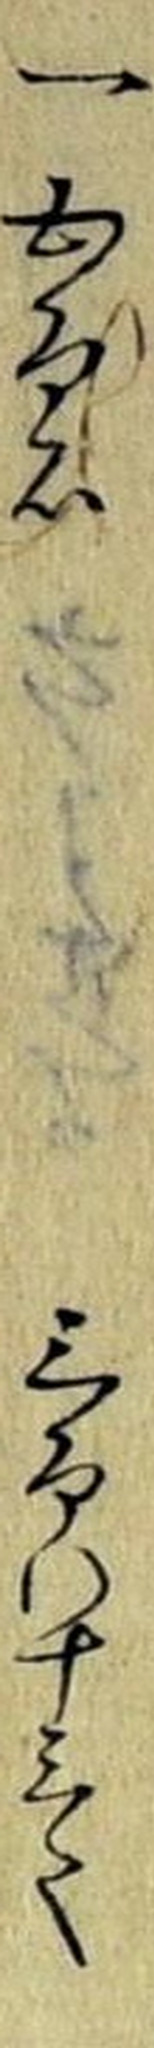一五百石三百八十三匁
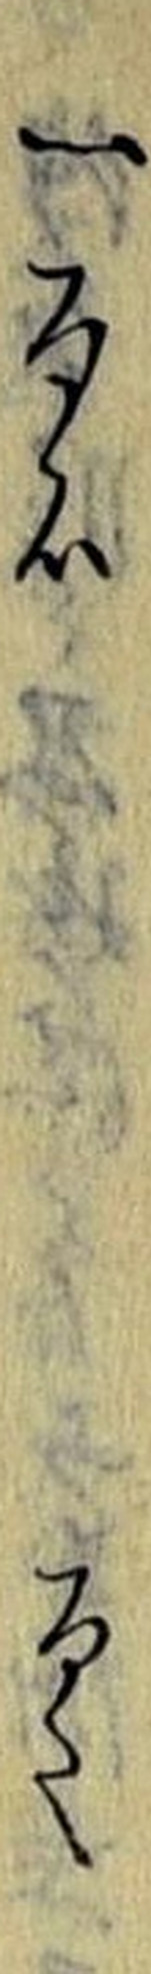一百石百匁
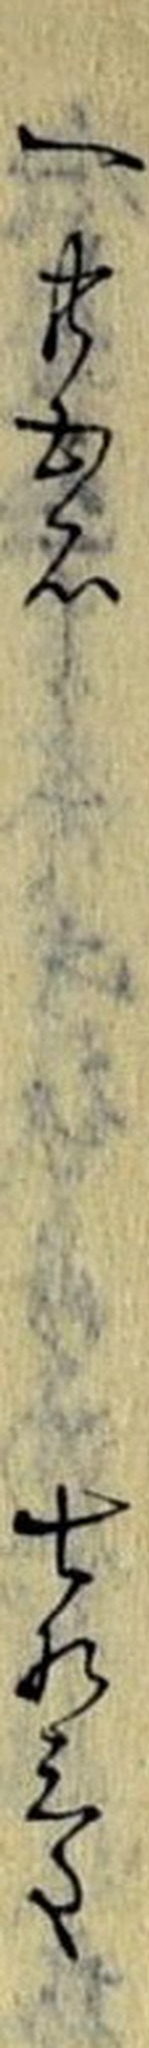一廿五石七拾三匁
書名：命令之部 四
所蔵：福井県文書館 Fukui Prefectural Archives
